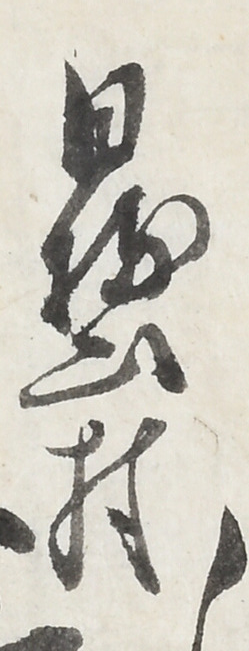日持山村
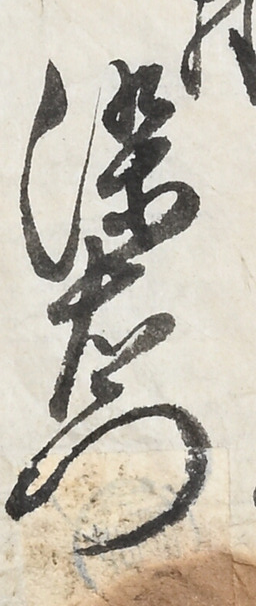染右衛門

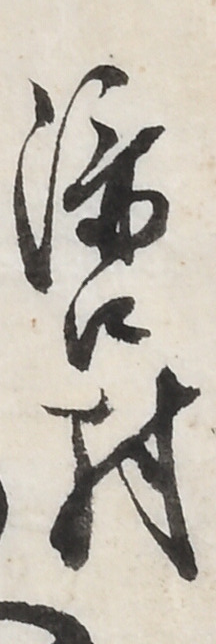添口村
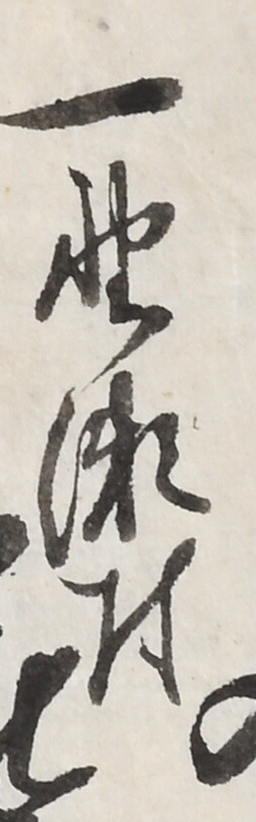一野瀬村
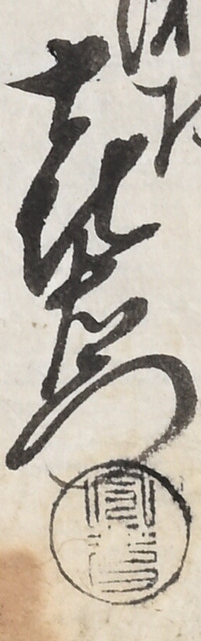繁右衛門
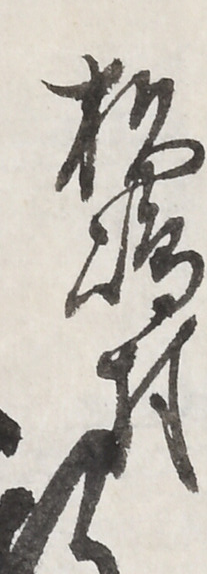杉嶋村
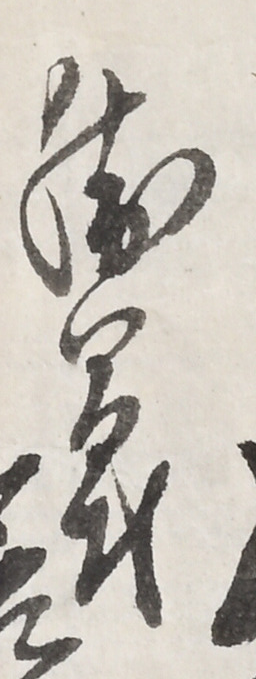勝間村
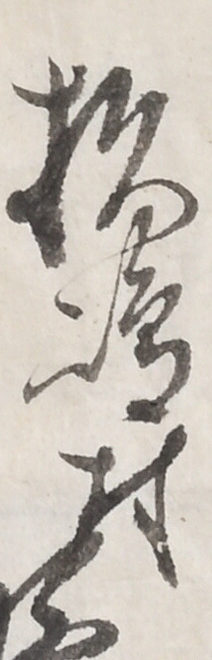杉嶋村
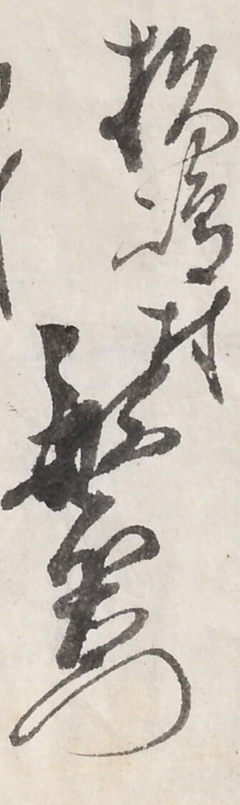繁右衛門
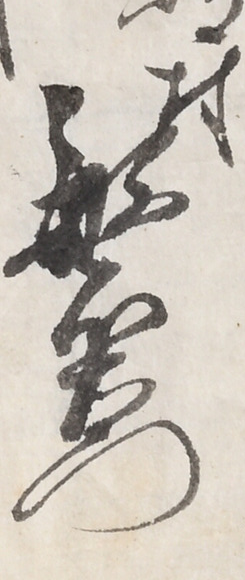繁右衛門
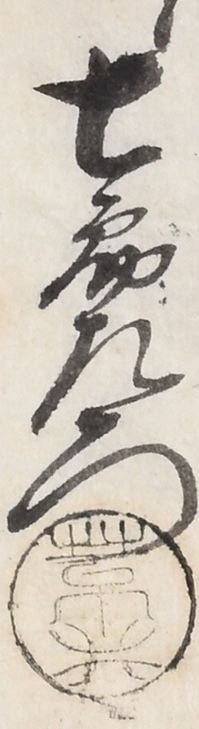七郎左衛門㊞
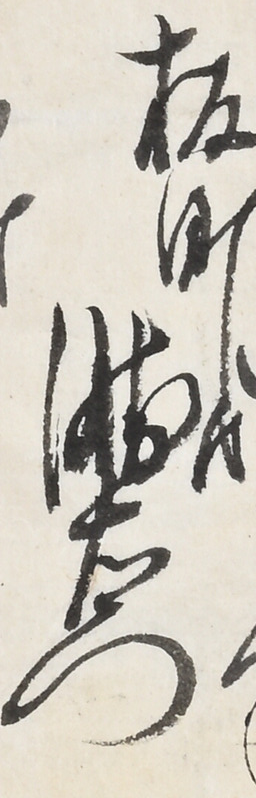勝右衛門
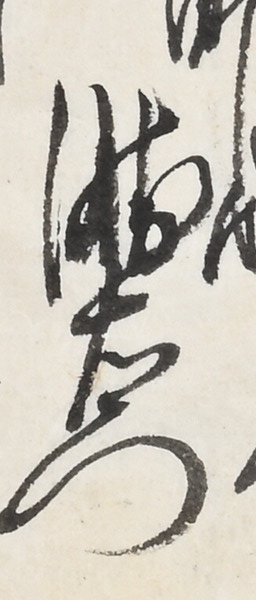繁右衛門
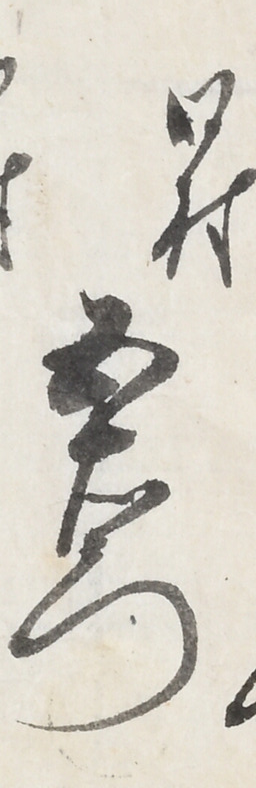五右衛門
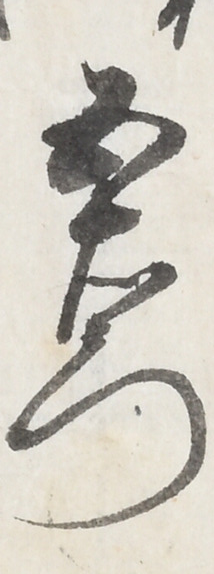五右衛門
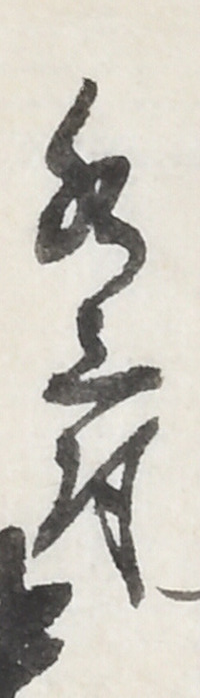水上村
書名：高遠御領分鍛冶相定帳
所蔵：伊那市立高遠町図書館・合同会社AMANE
